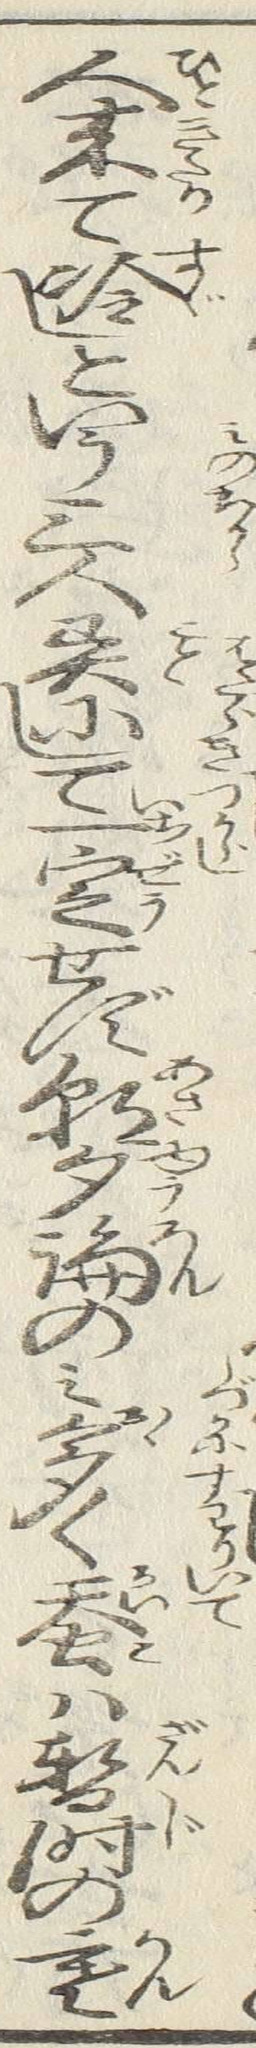人来て冷しという三人異にして一定せず朝夕論のみ多く蚕は暫時の寒
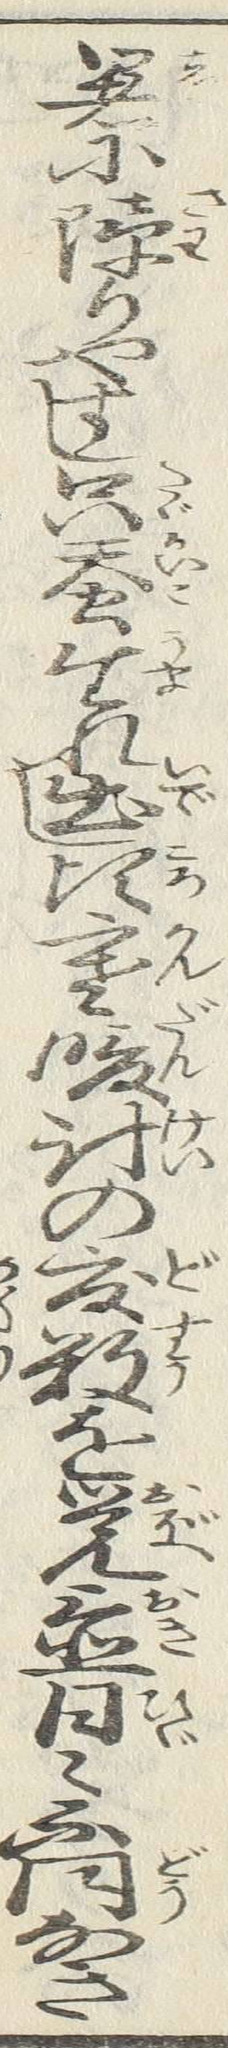暑しに障りやすし只蚕生れ出し頃寒暖計の度数を覚置日々ふ同なき
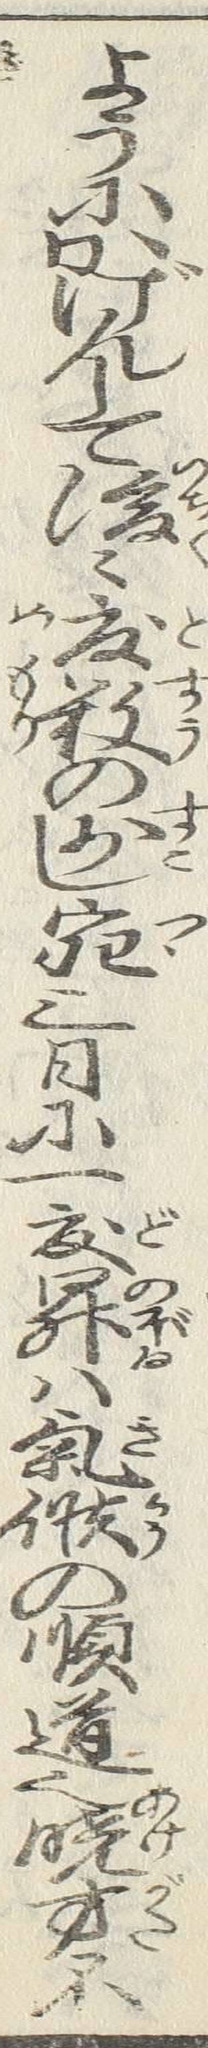ようにかげんして後々度数の少し宛三日に一度昇は気候の順道也暁方不
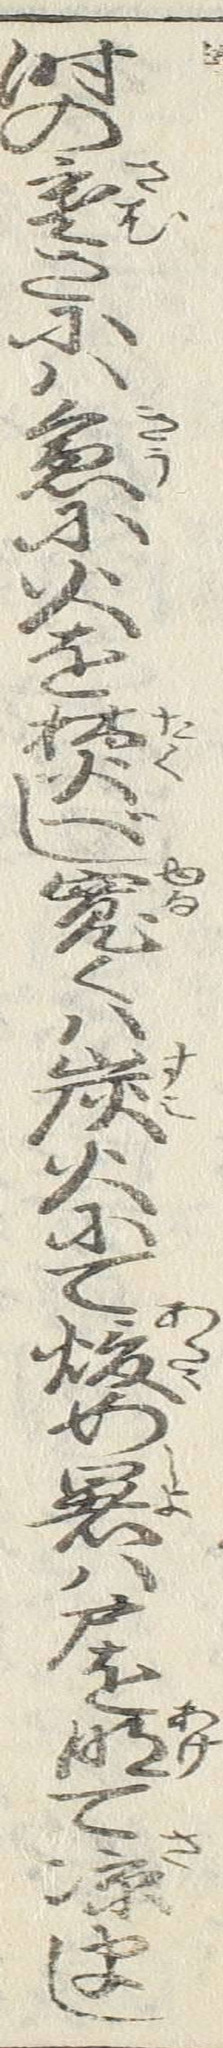時の寒さには急に火を焚べし寛くは炭火にて煖め暑は戸を明て涼まし
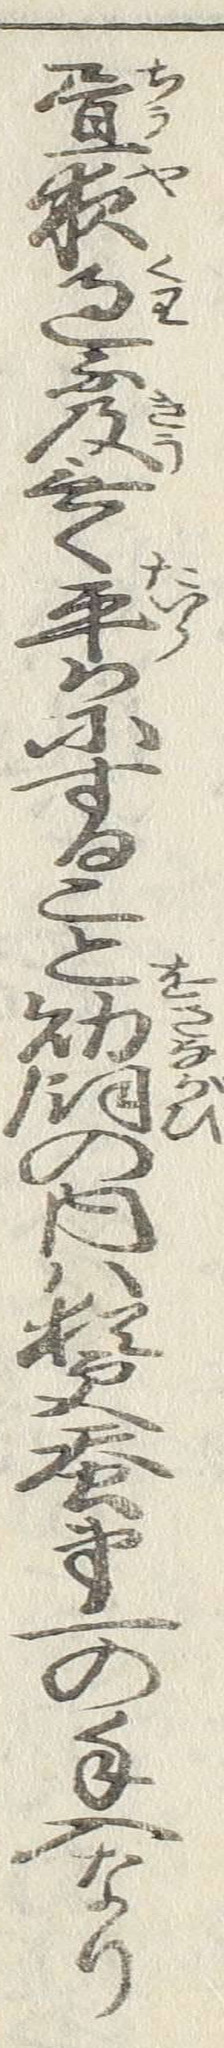昼夜過ふ及無く平かにすること幼飼の内は猶更蚕第一の手入なり
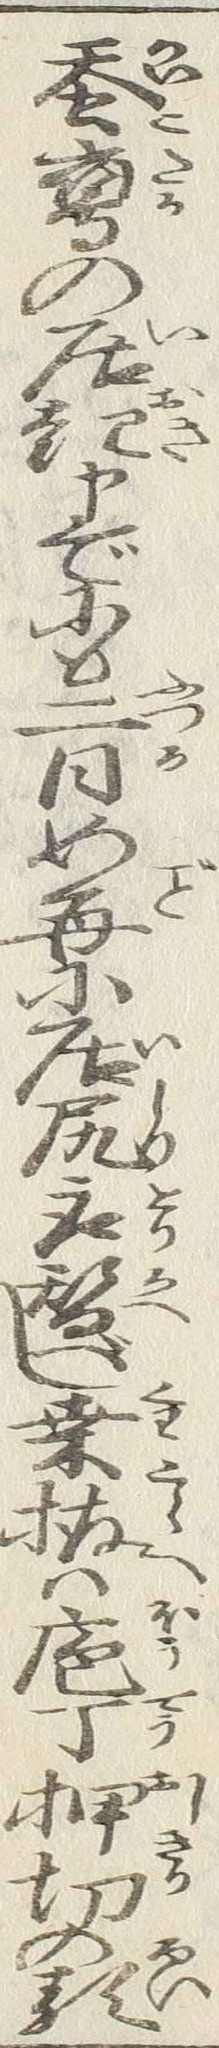蚕鷹の居起までにも二日め毎に居尻取替べし桑拵は庖丁押切の類
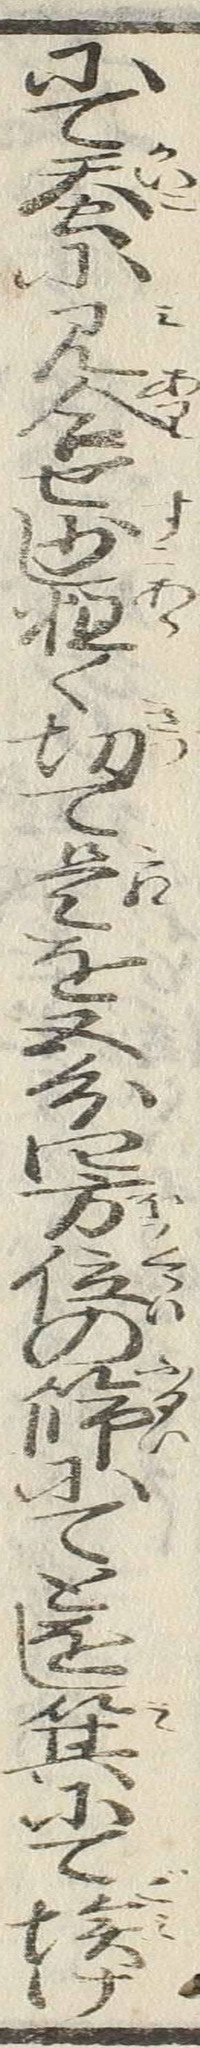にて蚕に見合せ少し粗く切て是を又五分四方位の篩にてとをし箕にて埃け
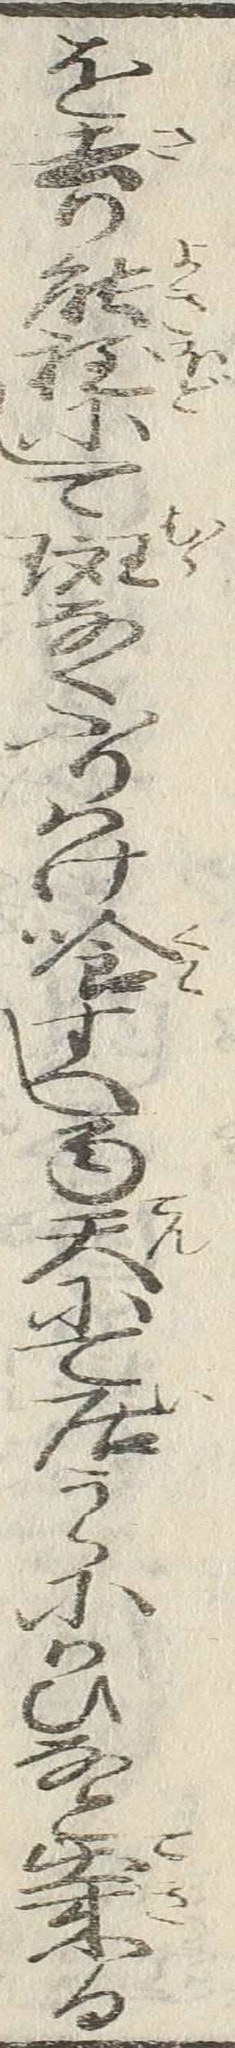を去り能程にして斑なくふりかけ喰すへし雨天にて居うらにかひなと出来る
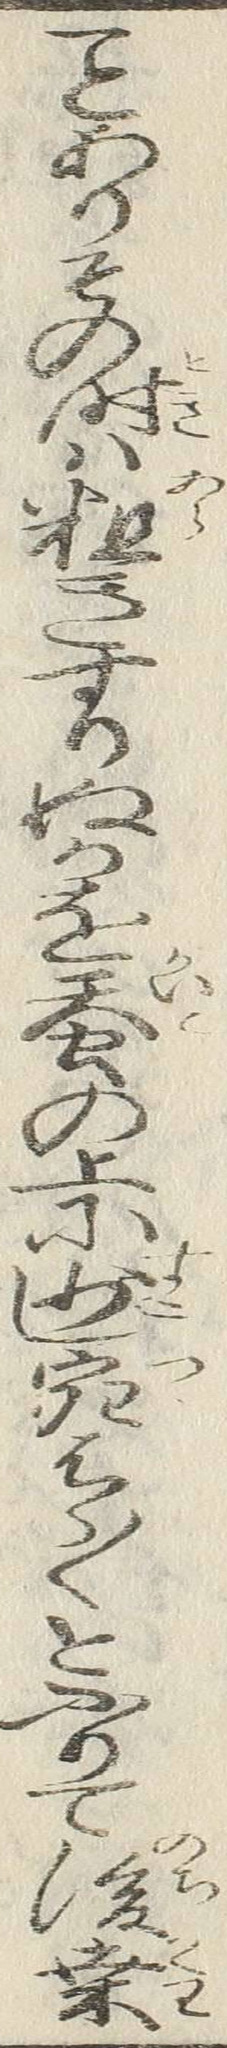ことありその時は粗きすりぬかを蚕の上に少し宛つはら〳〵とふりて後桑
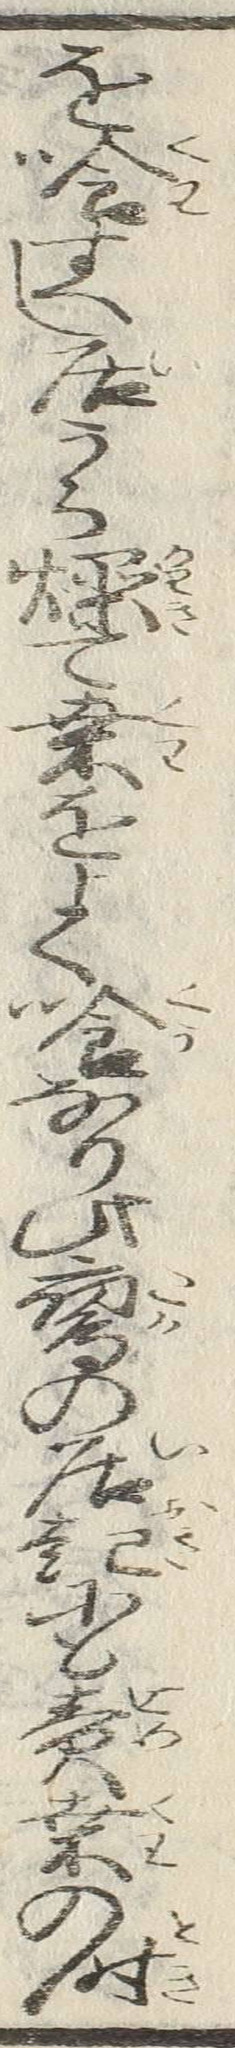を喰すへし居うら燥て桑をよく喰なり此鷹の居起にも責桑の時
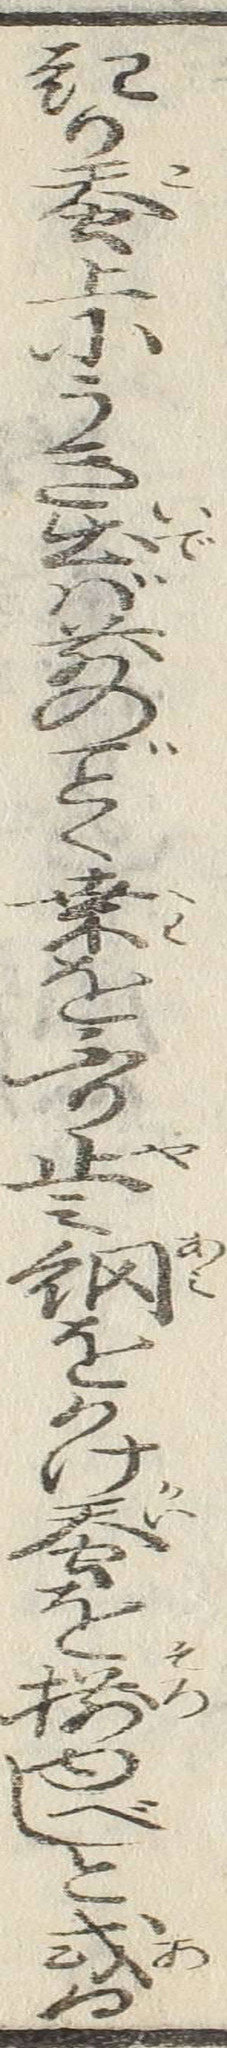起り蚕上にうき出ば前のごとく桑をふり止み網をかけ蚕かいを揃ゆべしと或る
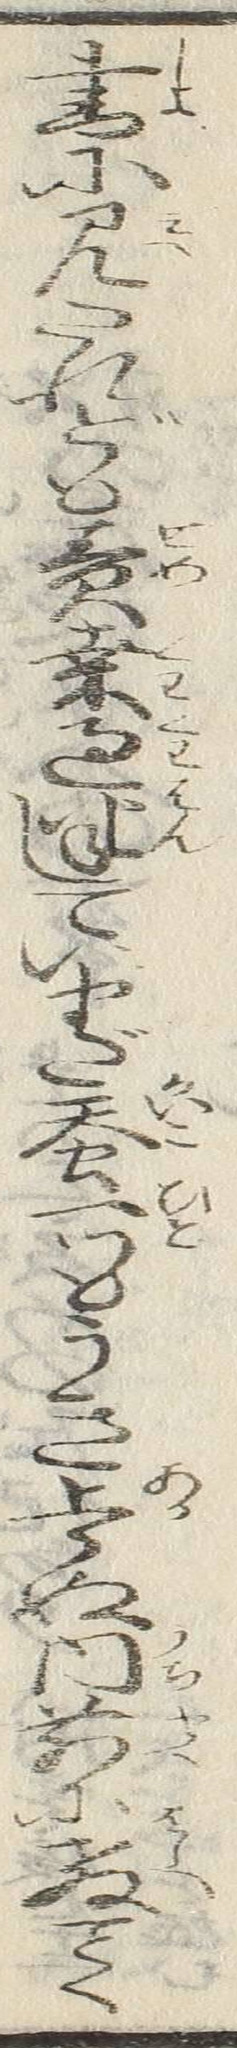書に見たれども責桑過半していまだ蚕一ッもうき上らぬ内前に教ことく
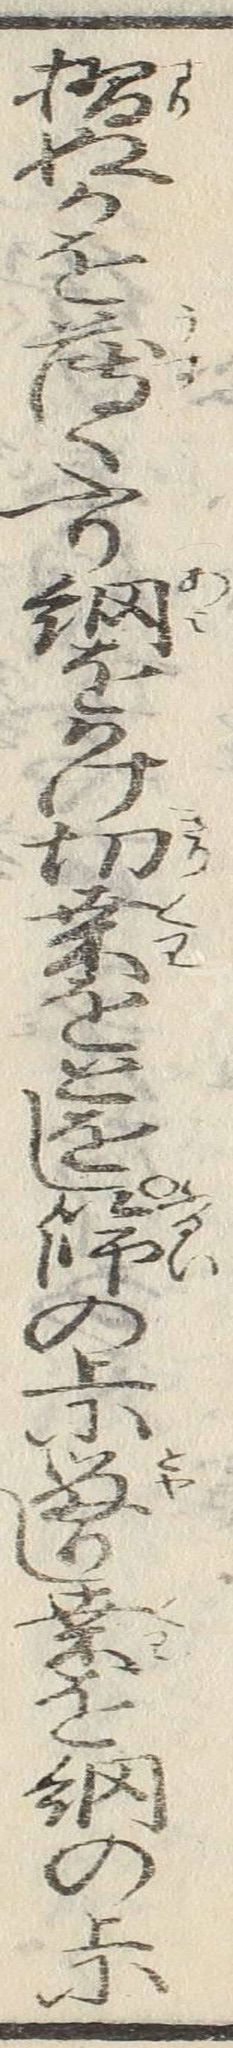摺ぬかを薄くふり網をかけ切桑をとをし篩の上に留りし桑を網の上に
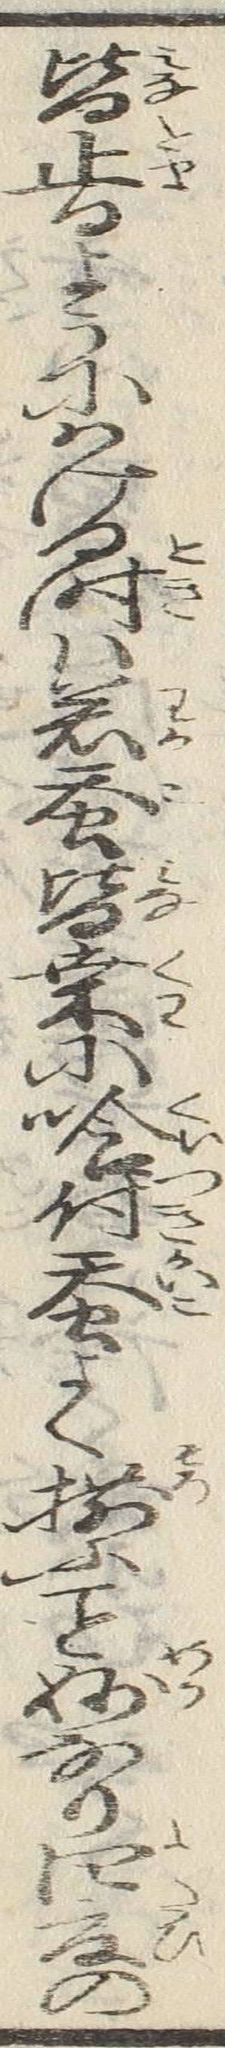皆止るようにかける時は若蚕皆桑に喰付蚕よく揃ふこと妙なり四度の
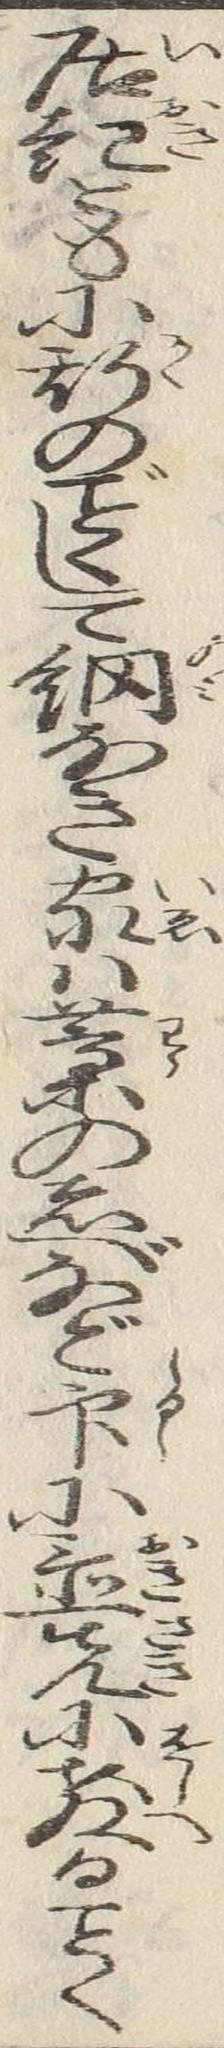居起ともに斯のごとくして網なき家は藁のしべなど印に置先に教ることく
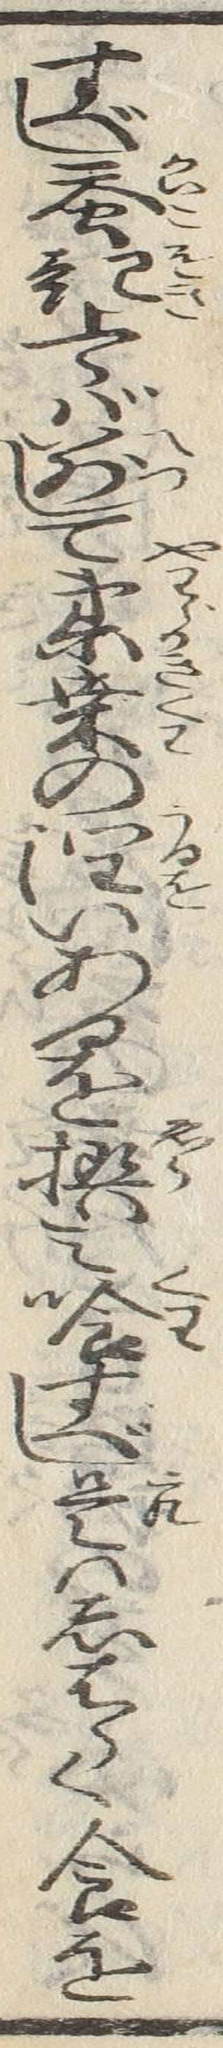すべし蚕起上らば別して柔桑の潤いあるを撰み喰すべし是は志はらく食を
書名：養蠶實驗録
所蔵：東京大学農学生命科学図書館 国文学研究資料館
